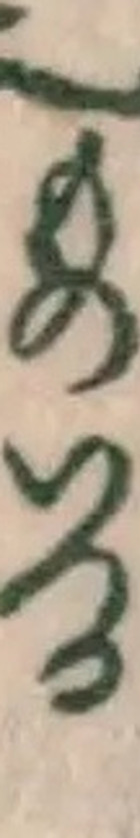ものいつる
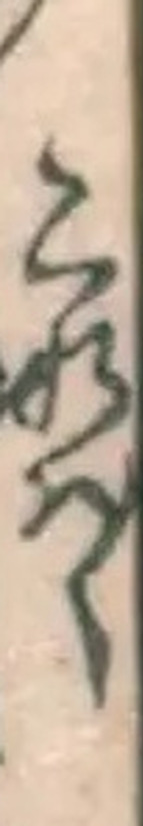これは〳〵
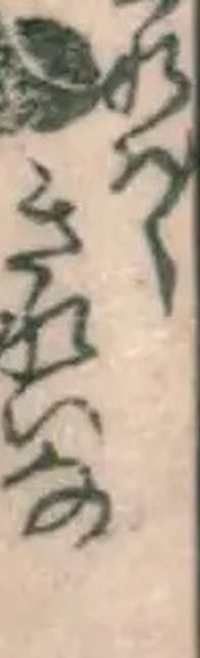きれいな
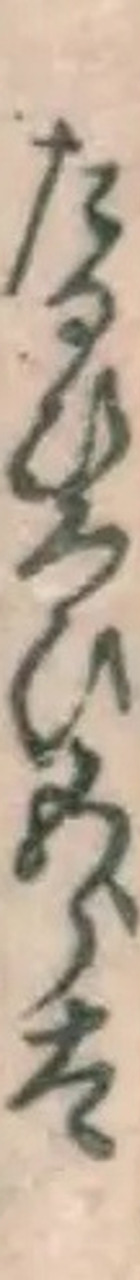たるひろひ五郎太
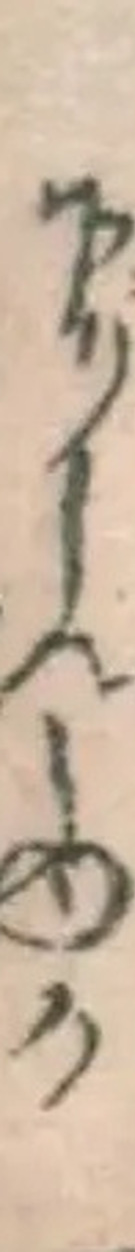下りしんしゆか
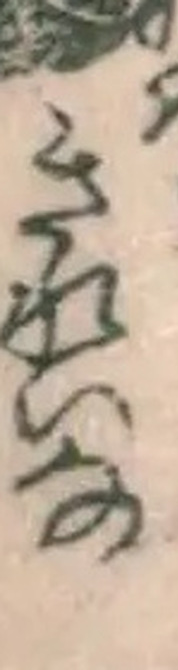きれいな
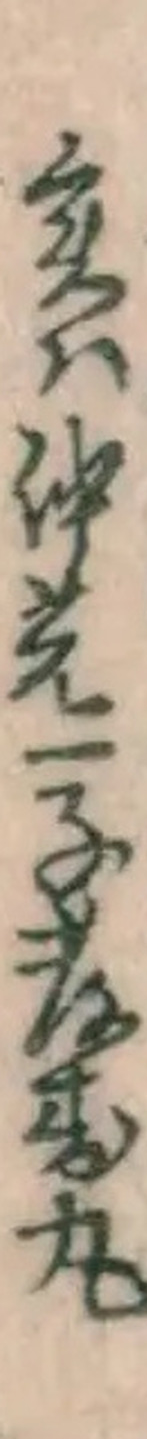実は仲光一子孝寿丸
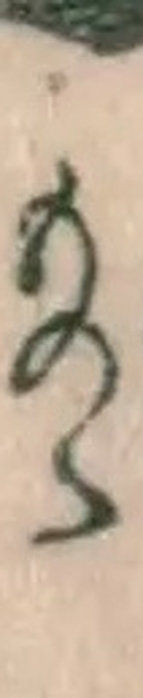ものた
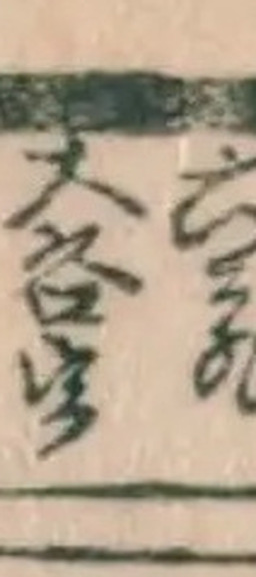大谷宇
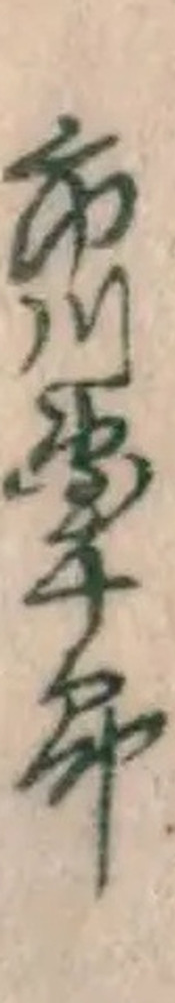市川団十郎
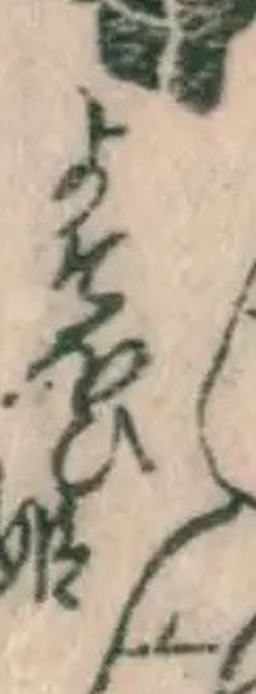よそほひ姫
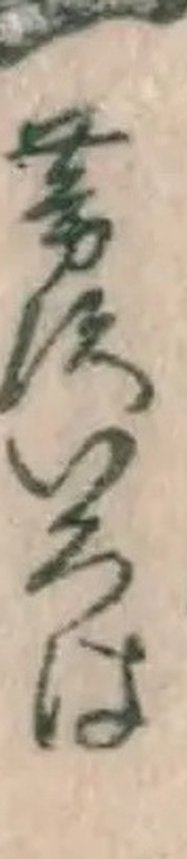芳沢いろは
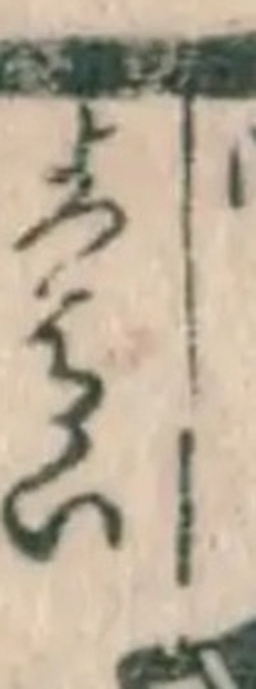ほつはらい
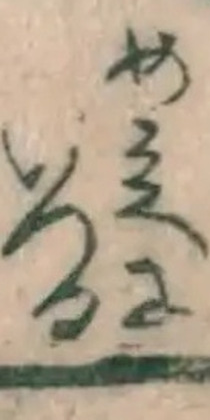いつる
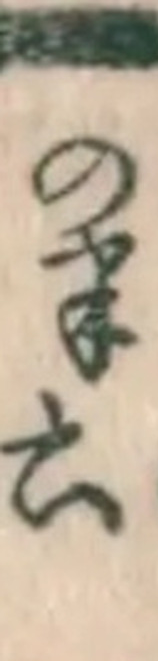の半六
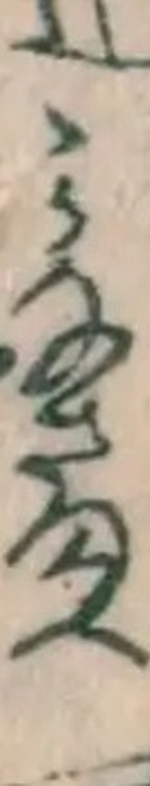みなさまへ
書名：菊慈童酒宴岩窟
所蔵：国立国会図書館 National Diet Library, JAPAN
